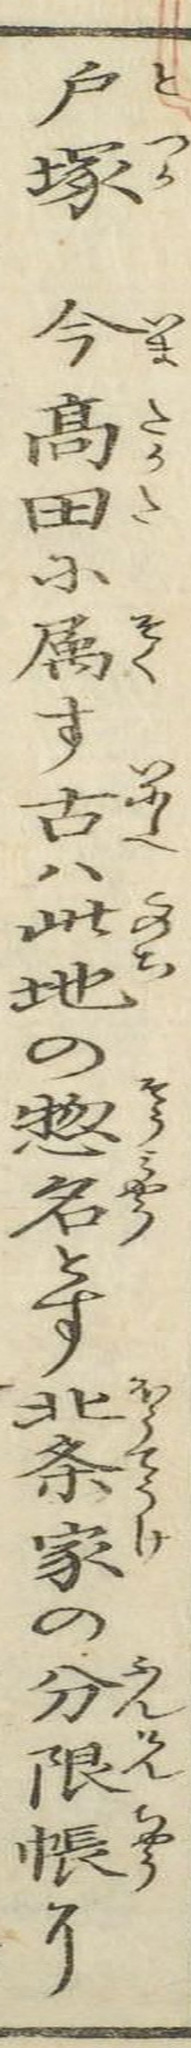戸塚今高田に属す古は此地の惣名とす北条家の分限帳に
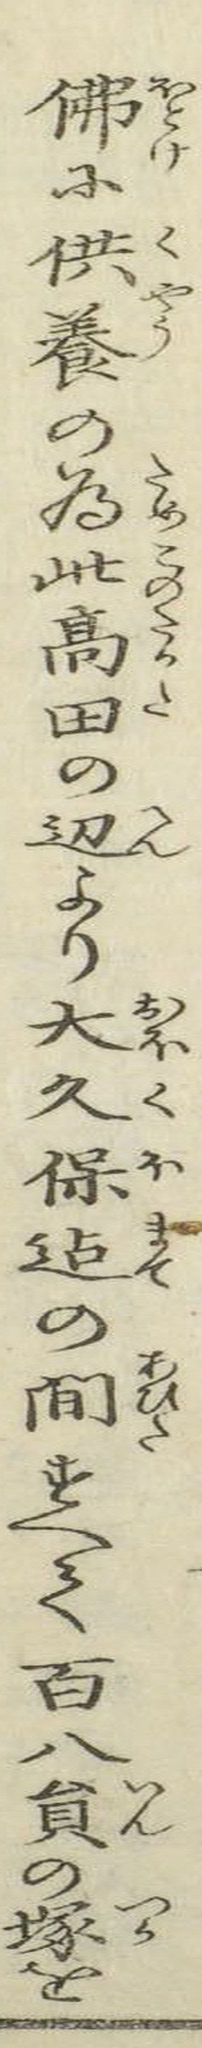佛に供養の為此高田の辺より大久保迄の間すへて百八員の塚を
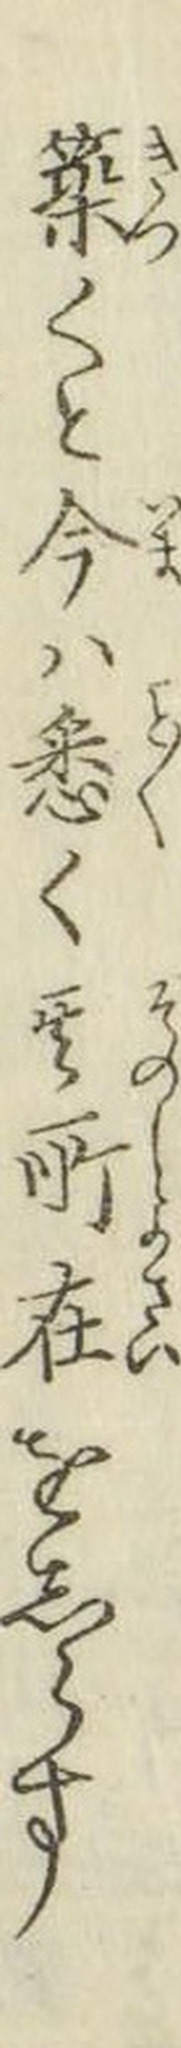築くと今は悉く其所在をしらす
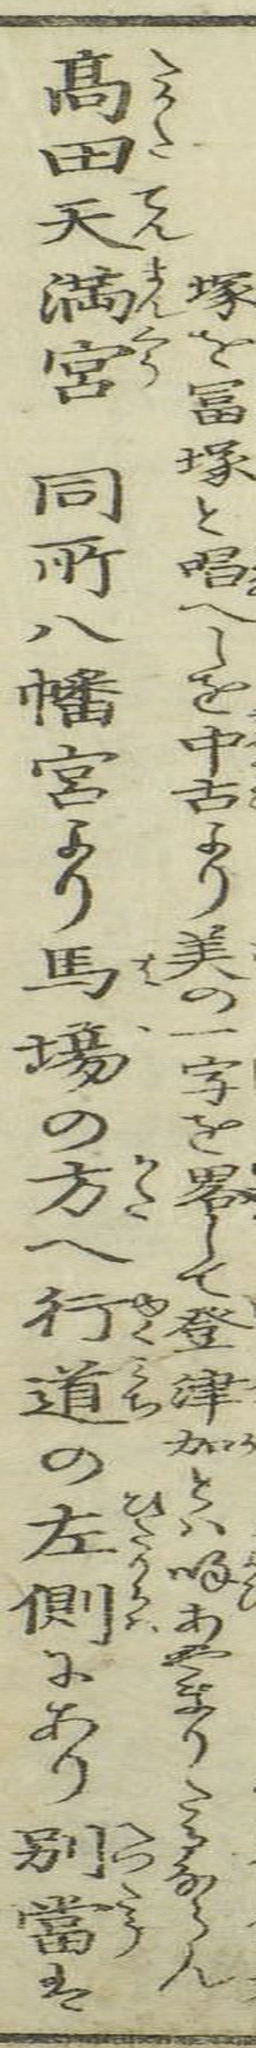高田天満宮同所八幡宮より馬場の方へ行道の左側にあり別当は

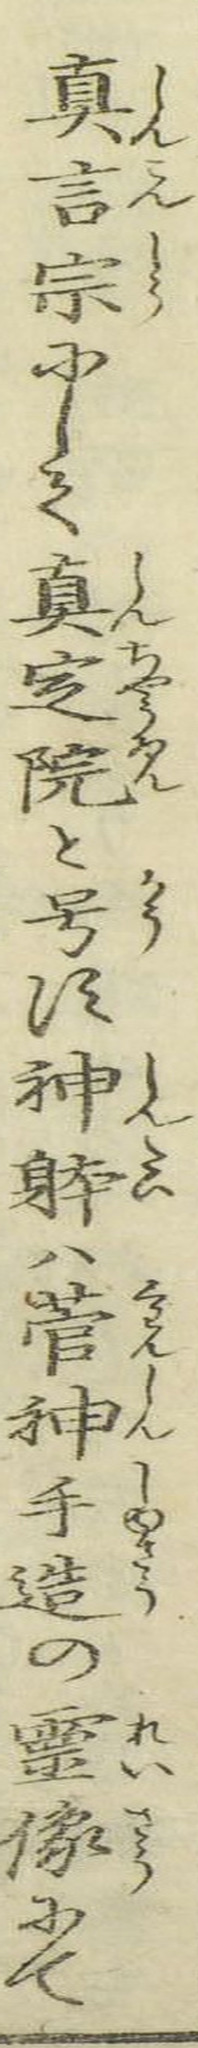真言宗にして真定院と号す神躰は菅神手造の靈像にて
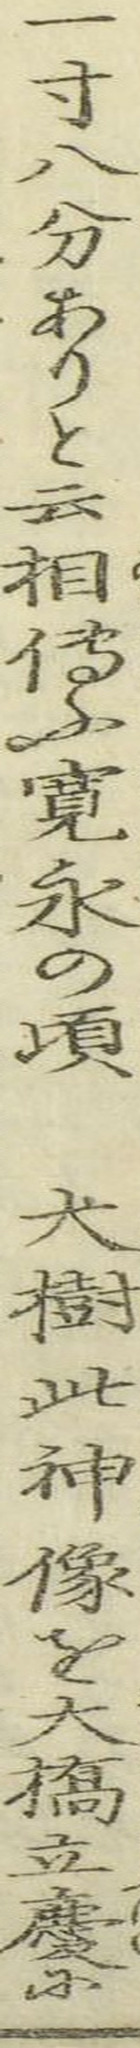一寸八分ありと云相博ふ寛永の頃大樹此神像を大橋立慶に
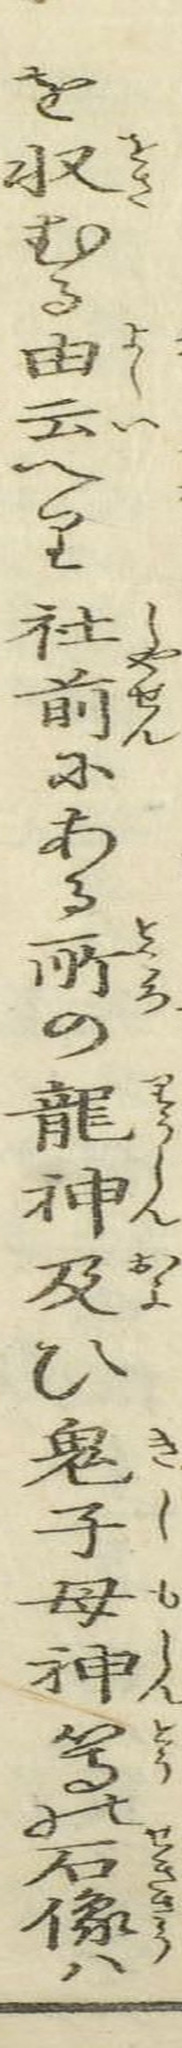を収むる由云へり社前にある所の龍神及ひ鬼子母神等の石像は
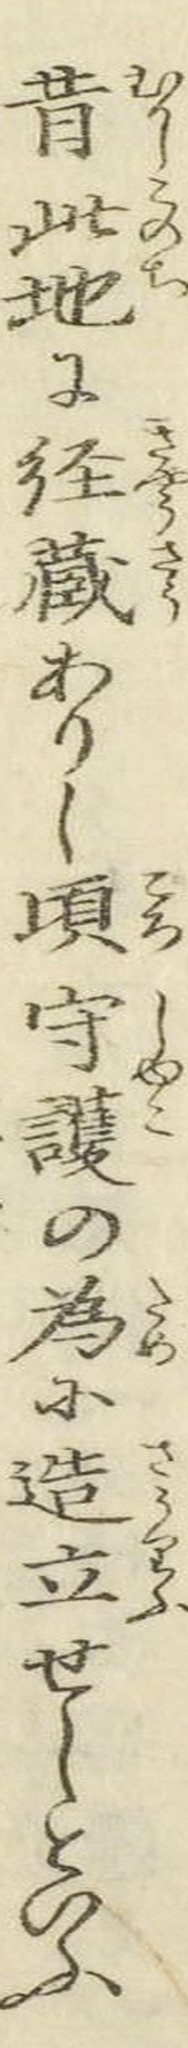昔此地に経蔵ありし頃守護の為に造立せしといふ
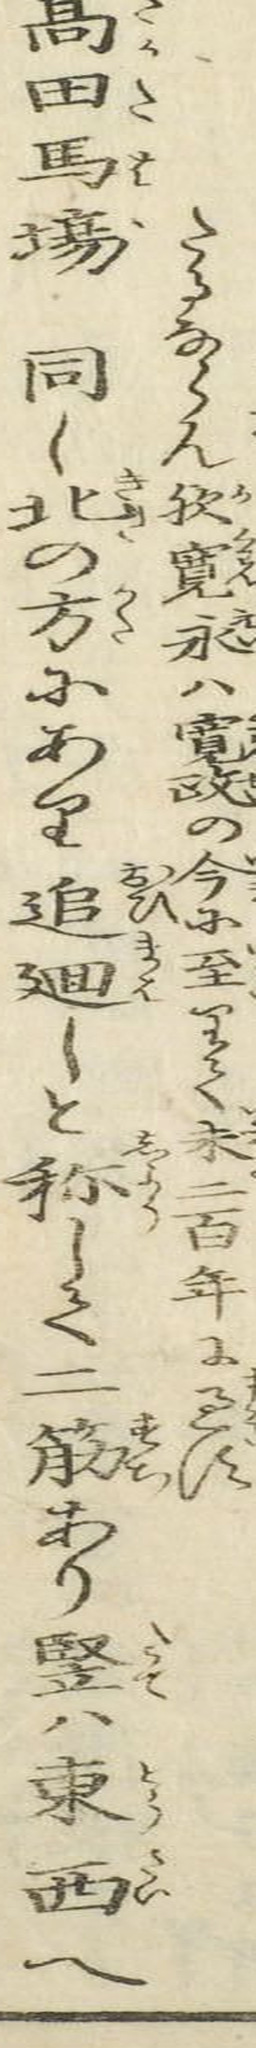高田馬塲同し北の方にあり追廻しと称して二筋あり竪は東西へ
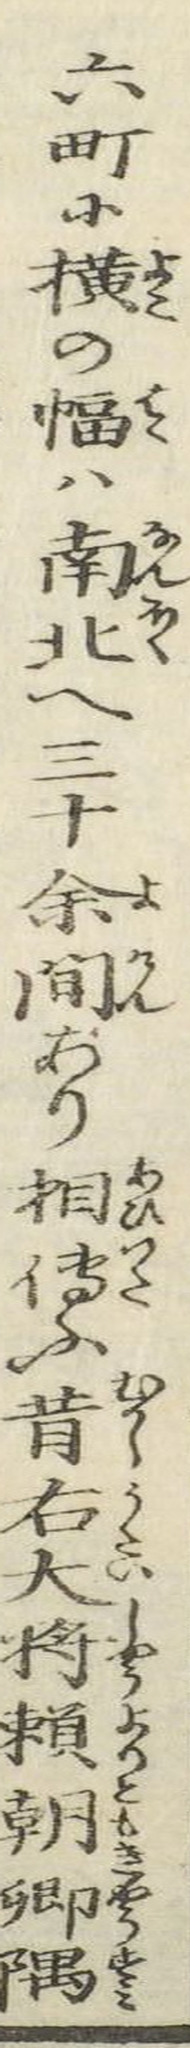六町に横の幅は南北へ三十余間あり相傳ふ昔右大将頼朝卿隅
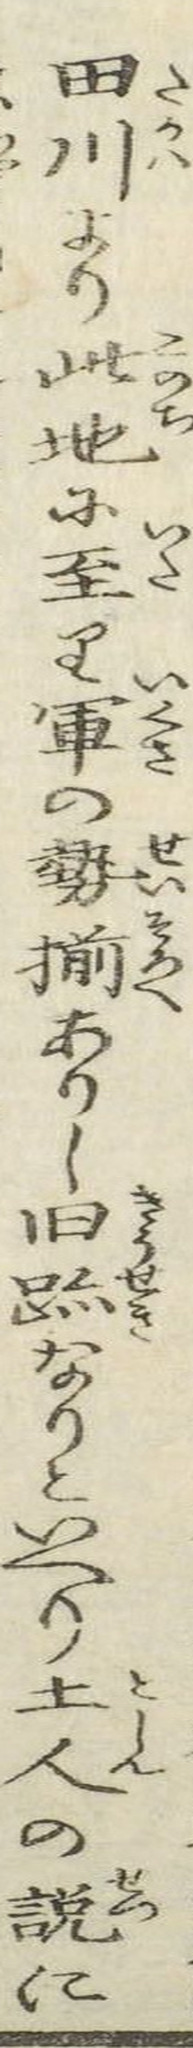田川より此地に至り軍の勢揃ありし旧跡なりといへり土人の説に
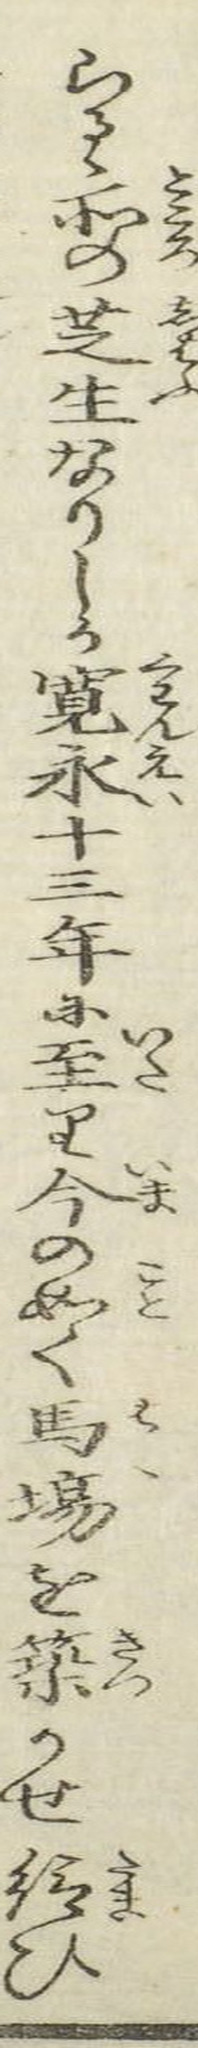らるゝ所の芝生なりしか寛永十三年に至り今の如く馬塲を築かせ給ひ
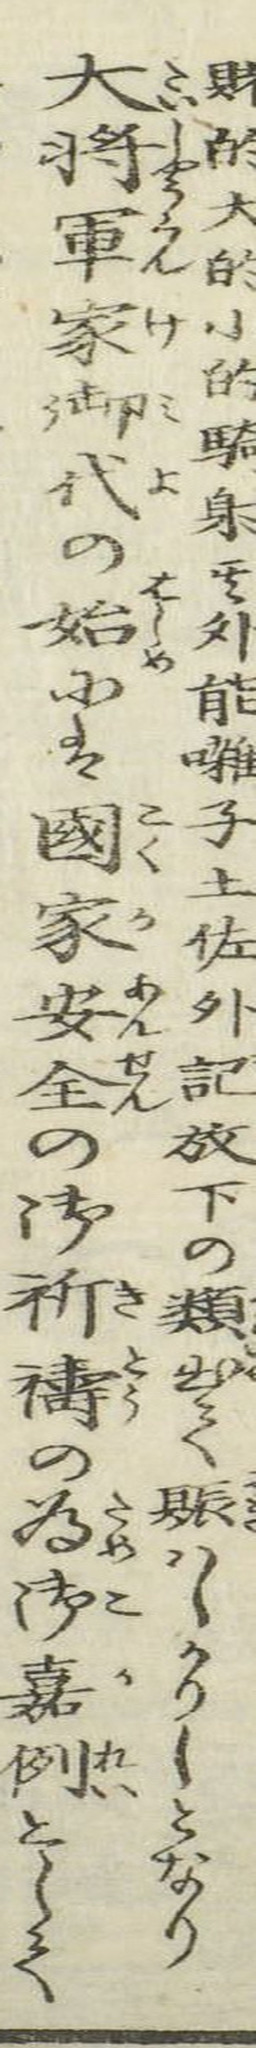大将軍家御代の始には國家安全の御祈禱の為御嘉例として
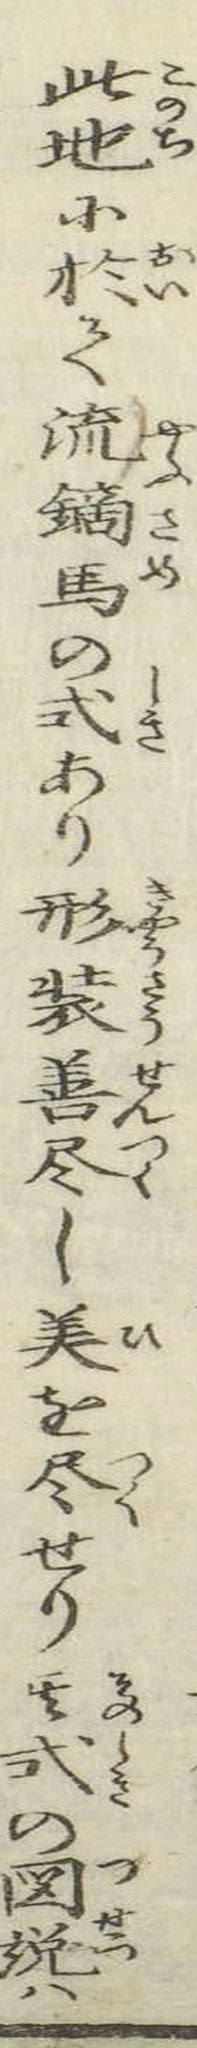此地に於て流鏑馬の式あり形装善尽し美を尽せり其式の図説は
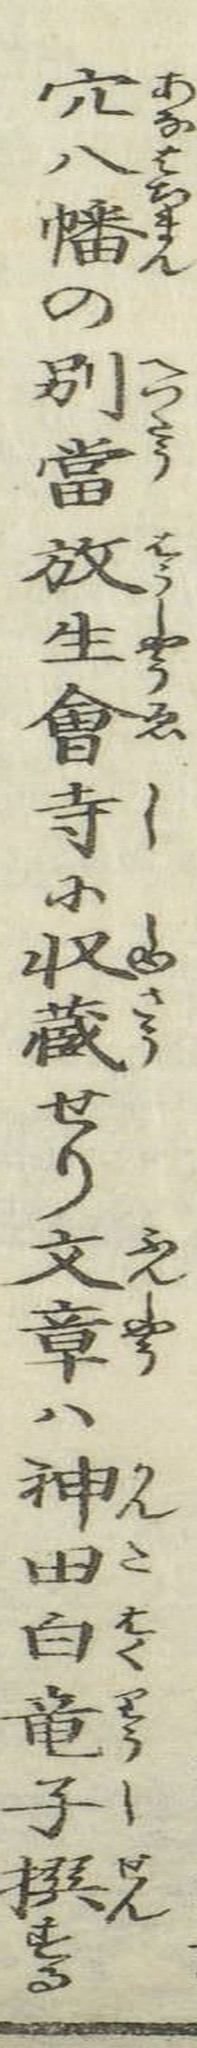穴八幡の別當放生會寺に収蔵せり文章は神田白竜子撰する
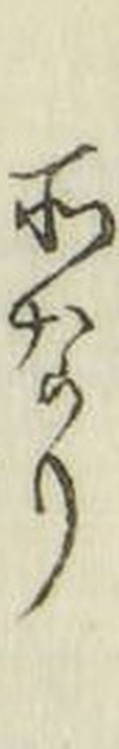所なり
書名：江戸名所図会 20巻 巻之12
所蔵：東京学芸大学教育コンテンツアーカイブ
